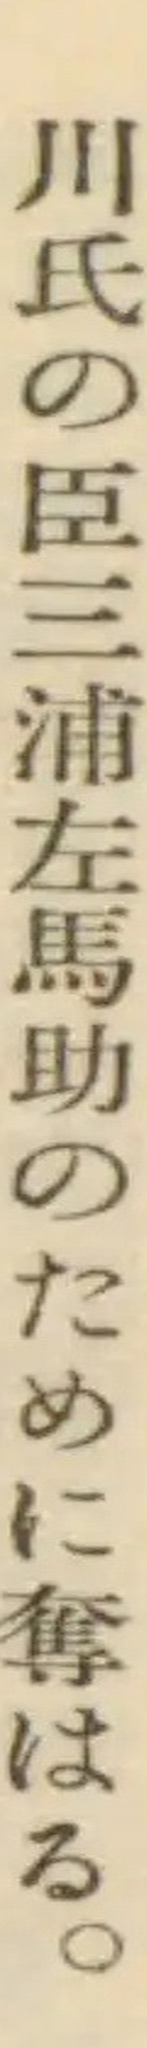川氏の臣三浦左馬助のために奪はる。
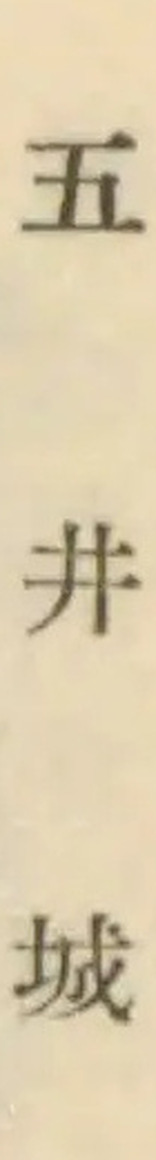五井城
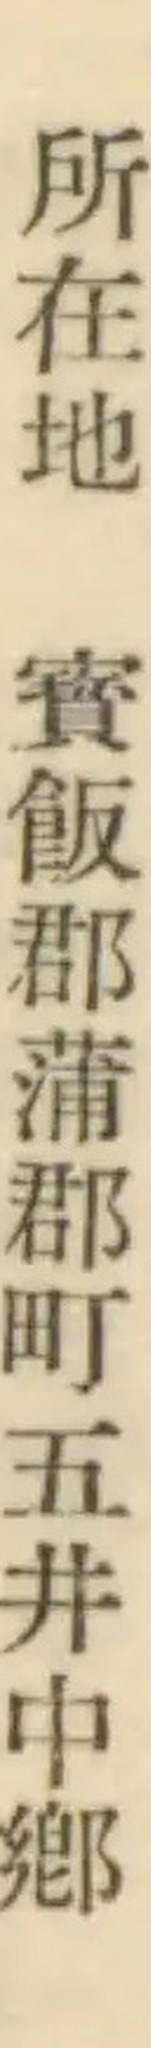所在地宝飯郡蒲郡町五井中郷
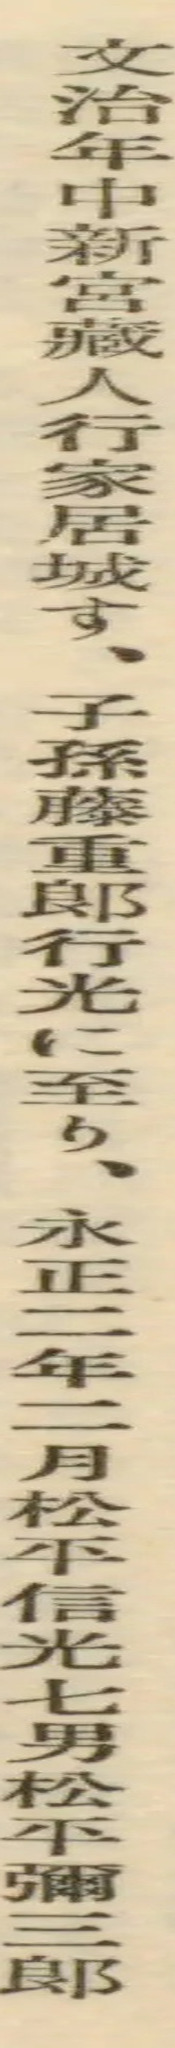文治年中新宮蔵人行家居城す、子孫藤重郎行光に至り、永正二年二月松平信光七男松平弥三郎
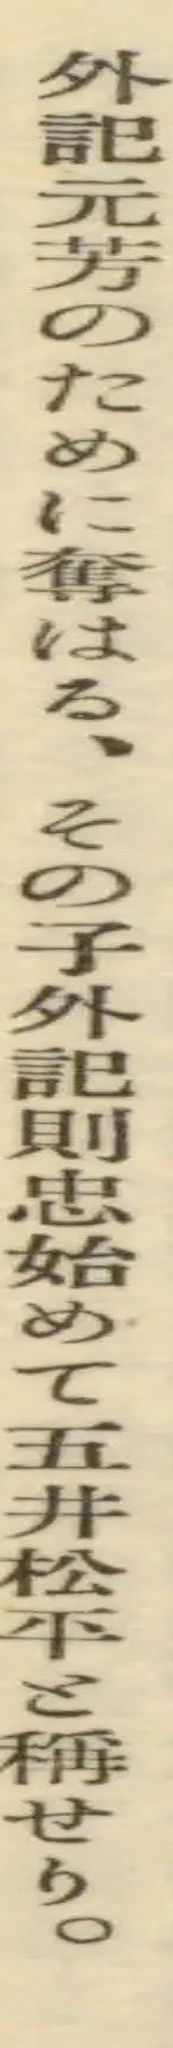外記元芳のために奪はる、その子外記則忠始めて五井松平と称せり。
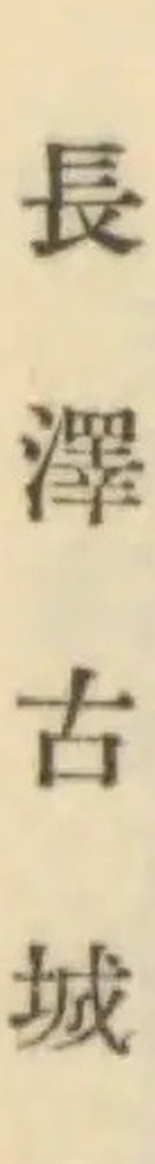長沢古城
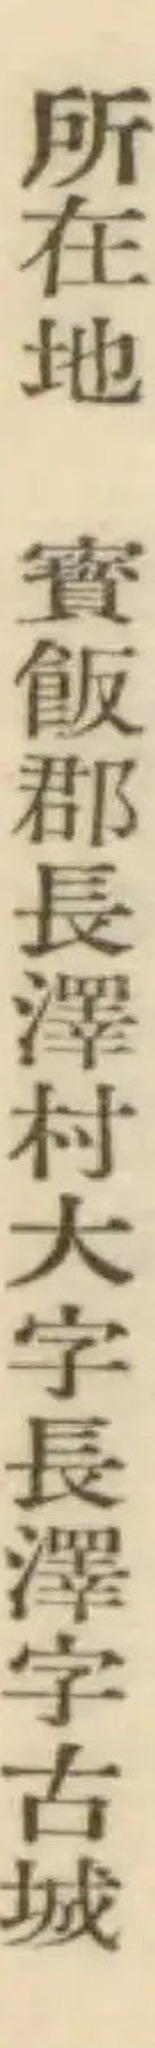所在地宝飯郡長沢村大字長沢字古城
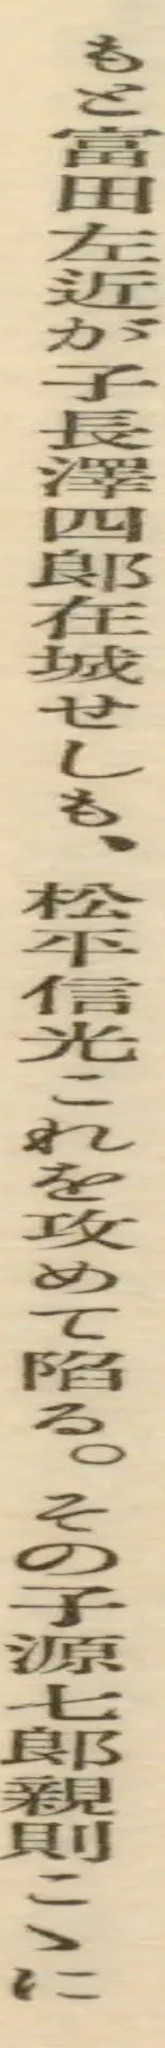もと富田左近が子長沢四郎在城せしも、松平信光これを攻めて陥る。その子源七郎親則こゝに
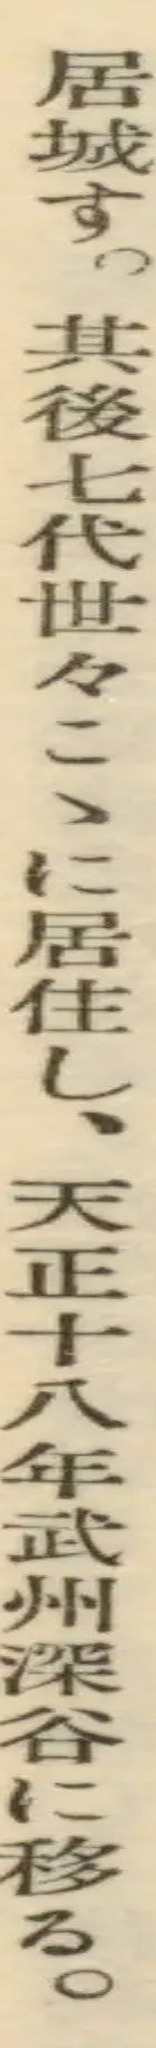居城す。其後七代世々こゝに居住し、天正十八年武州深谷に移る。
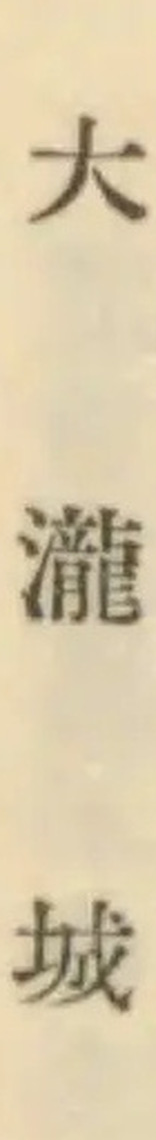大瀧城
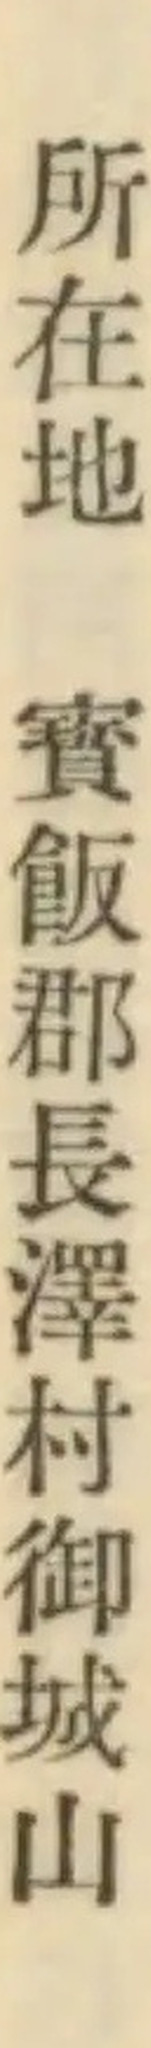所在地宝飯郡長沢村御城山
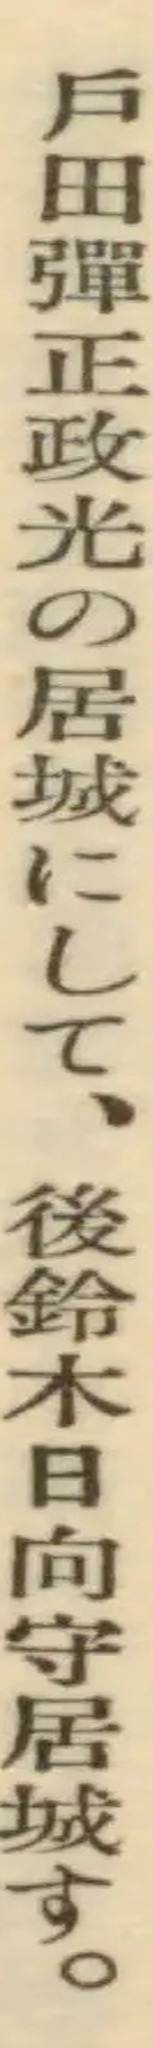戸田弾正政光の居城にして、後鈴木日向守居城す。
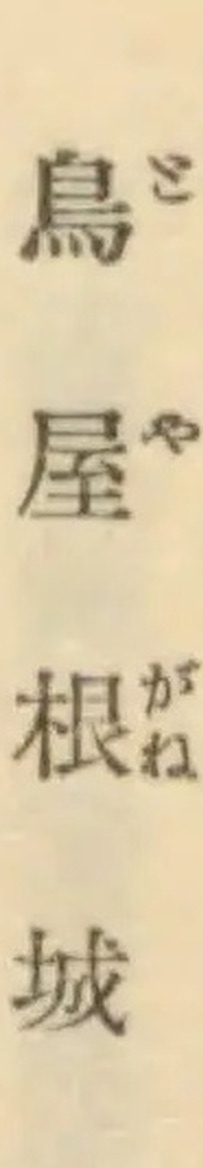鳥屋根城
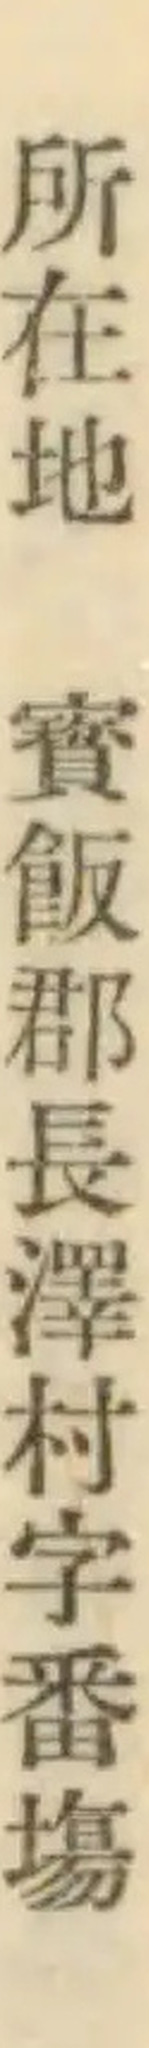所在地宝飯郡長沢村字番場
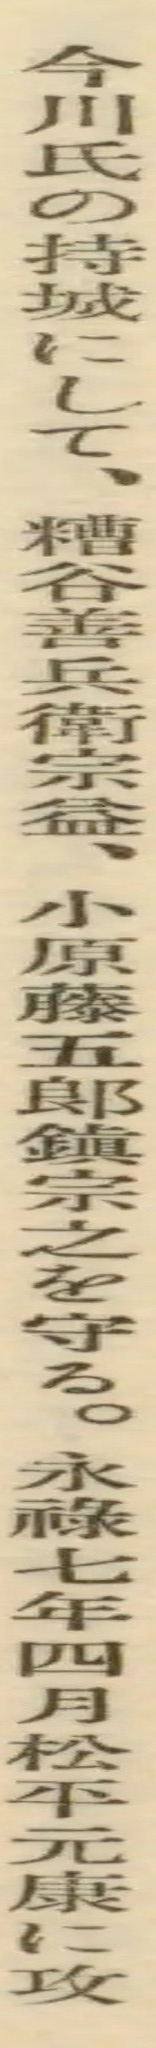今川氏の持城にして、糟谷善兵衛宗益、小原藤五郎鎮宗之を守る。永禄七年四月松平元康に攻
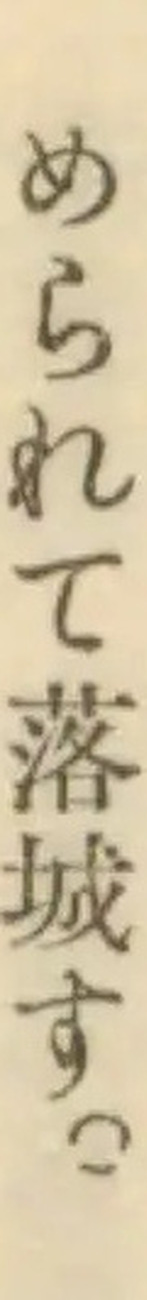められて落城す。
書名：東三河之古城
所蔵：国立国会図書館 National Diet Library, JAPAN
